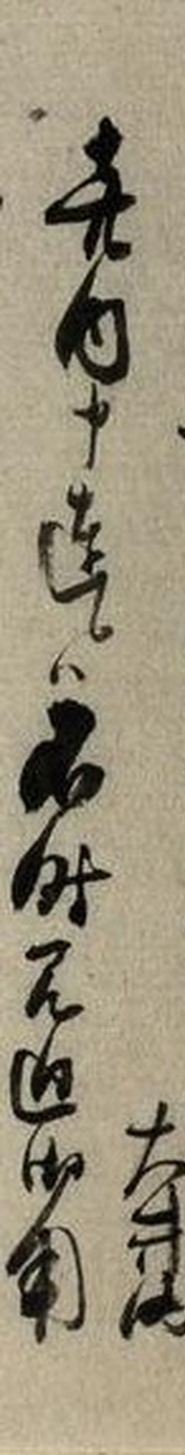喜内申達候は不時見廻御用
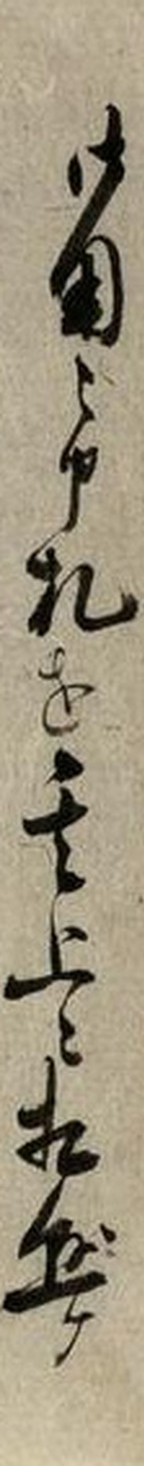御用と申札を其上に相懸ケ
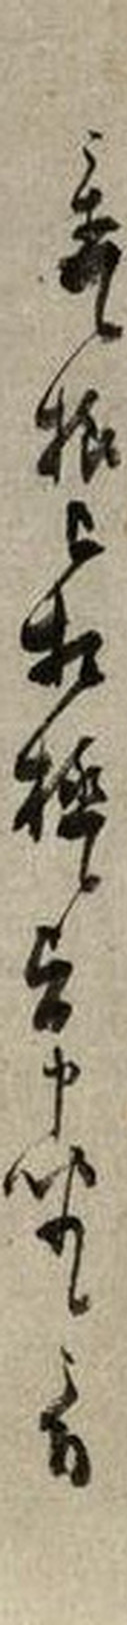置候様被相極候旨申聞候に付
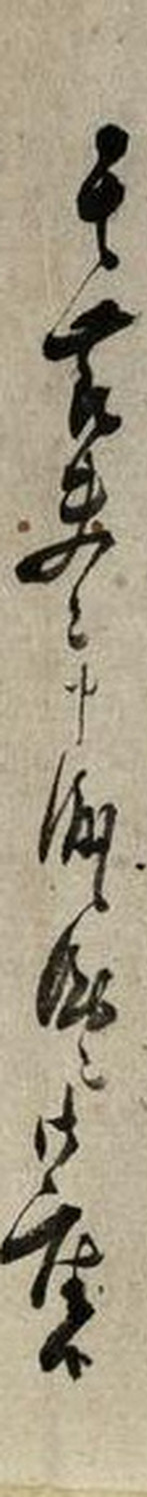其節夫々申渡候儀に御座候
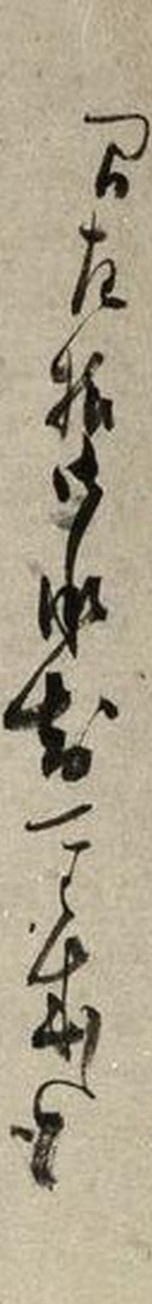間左様御承知可被成候以上
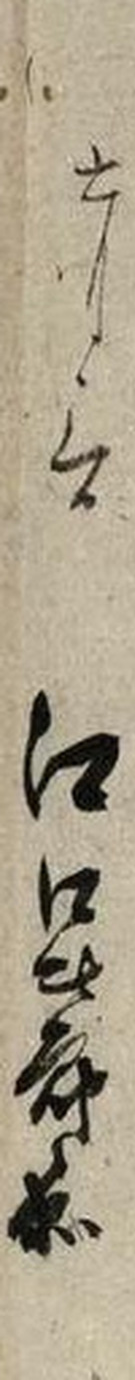六月三日江口次郎兵衛
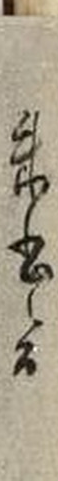朱書之付
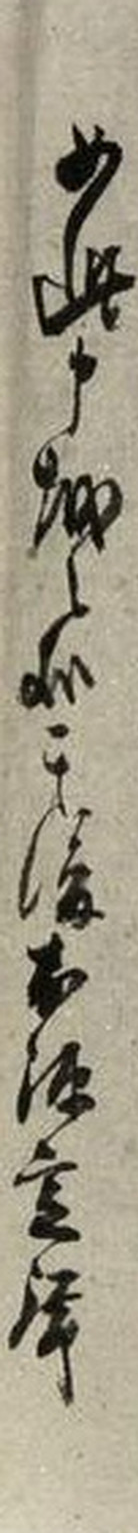如此申越之処其後本源定席
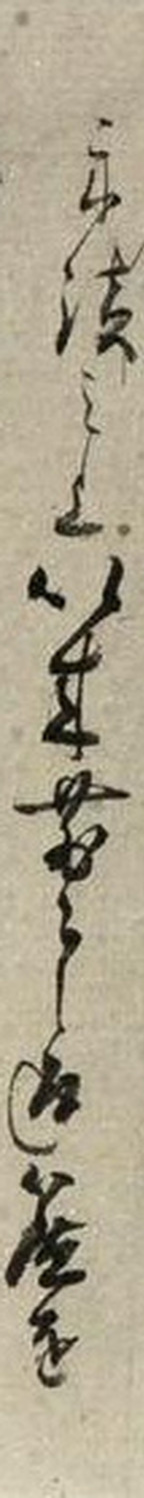示談之上以来前々之通簾を
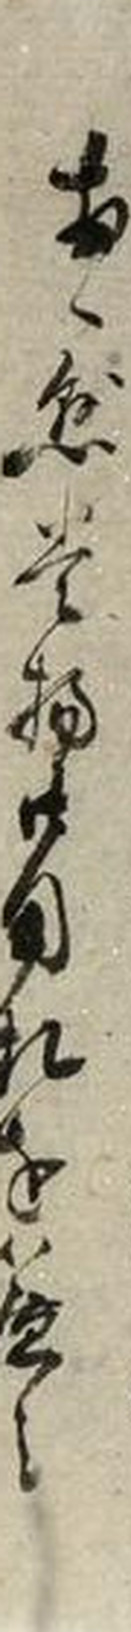前へ懸巻揚御用札を簾之

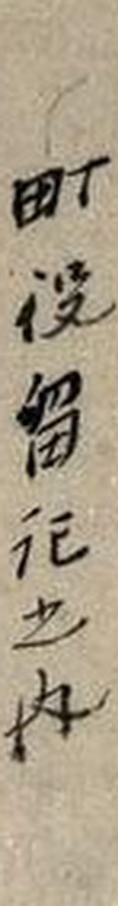町役留記之内

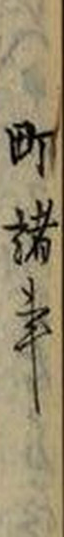町諸事
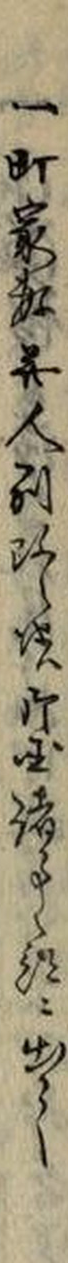一町家数并人別改之儀は御国諸事之部に出之
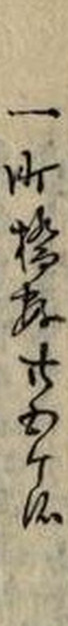一町橋数廿五ケ所
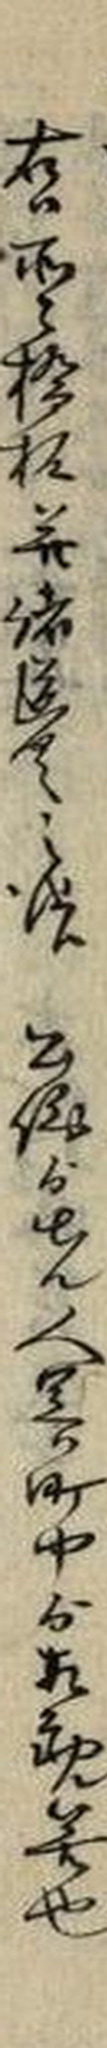右は所々橋板并諸道具之儀は公儀ゟ出ル人足は町中ゟ相勤ル筈也
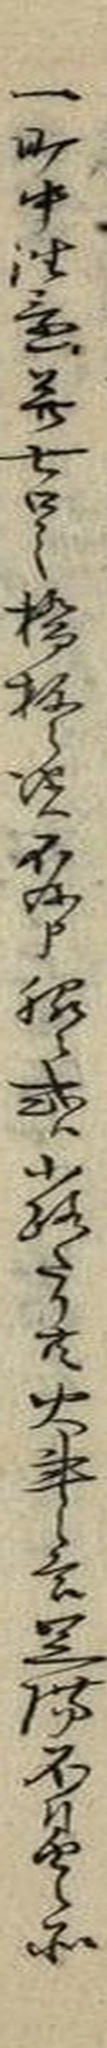一町中往還并七口之橋板之儀は不及申脇々或は小路たり共火事之節足場不自由之所
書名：御城下諸事之部
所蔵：福井県文書館 Fukui Prefectural Archives
